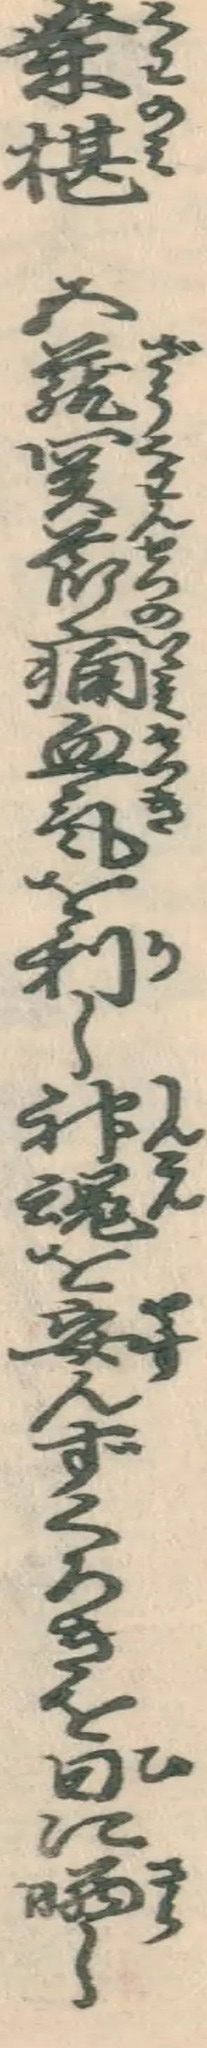桑椹五臓関節痛血気を利し神魂を安んずくろきを日に晒し
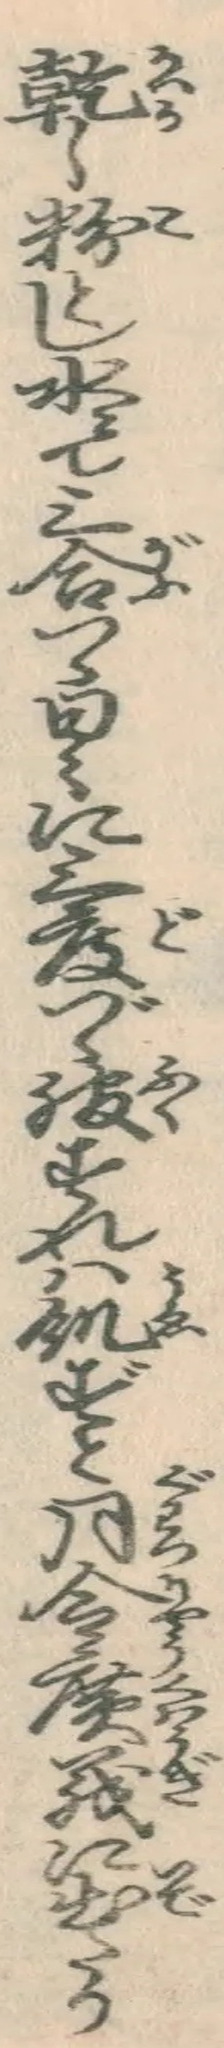乾し粉とし水にて三合つゝ日々に三度づゝ服すれは飢ずと月令広義に出たり
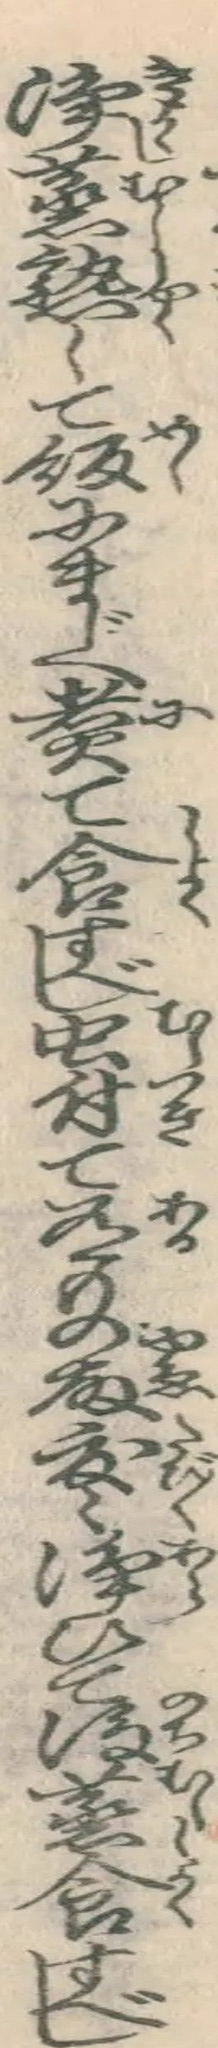浄蒸熟して飯にまじへ煑て食すべし虫付て有もの故度々浄ひて後蒸食すべし
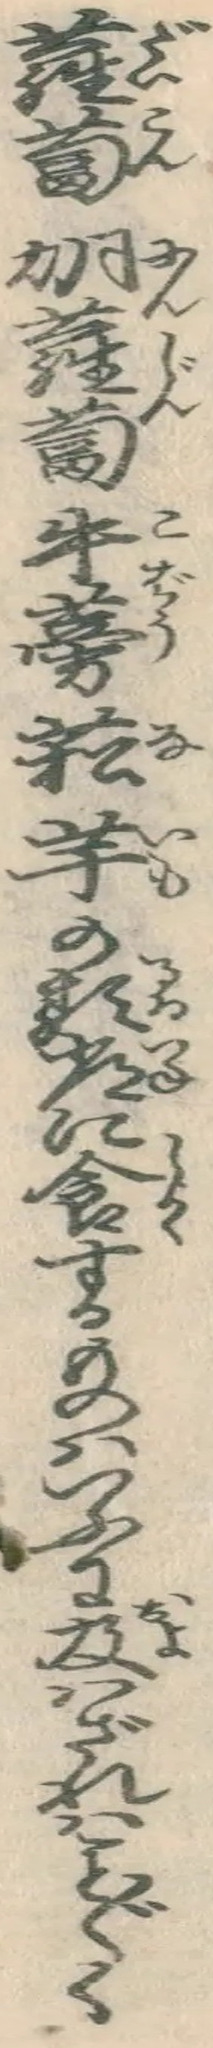蘿蔔胡蘿蔔牛蒡菘芋の類常に食するものはいふに及はざれはこと〴〵く
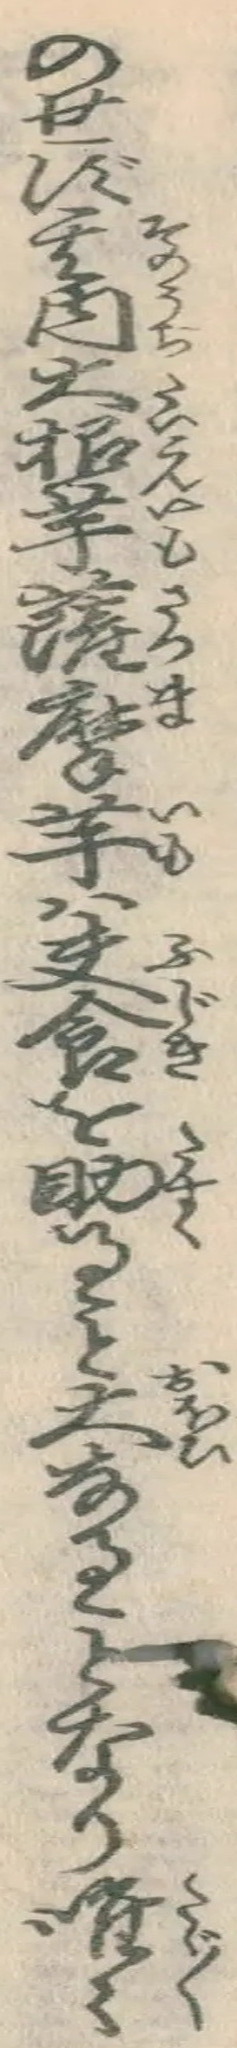のせず其内大根芋薩摩芋は夫食を助ること大なることなり唯々
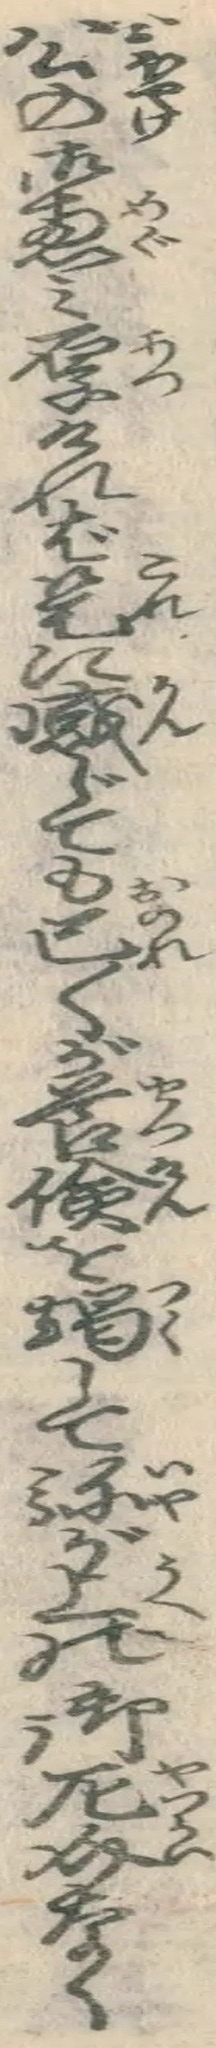公の御恵み厚ければ是に感じても己〳〵が節倹を竭して弥が上の御厄介なく
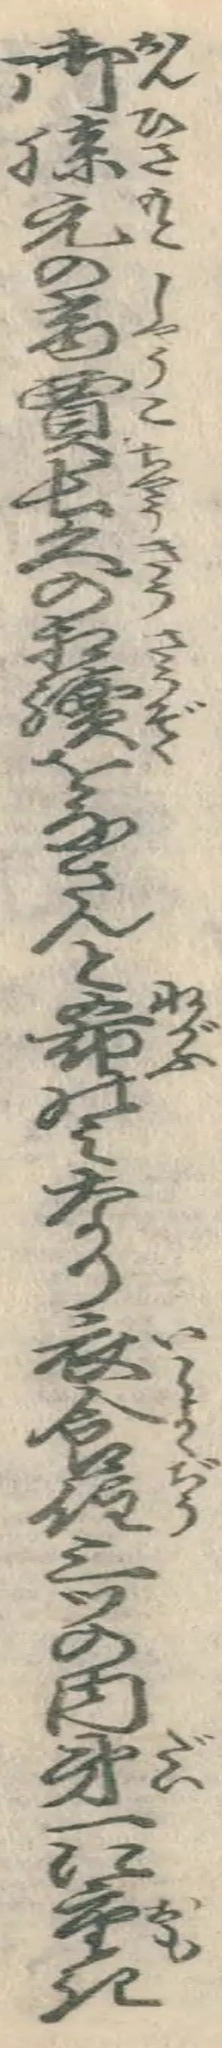御膝元の商賈長久の相続をなさんと希のみなり衣食住三ッの内第一に重き
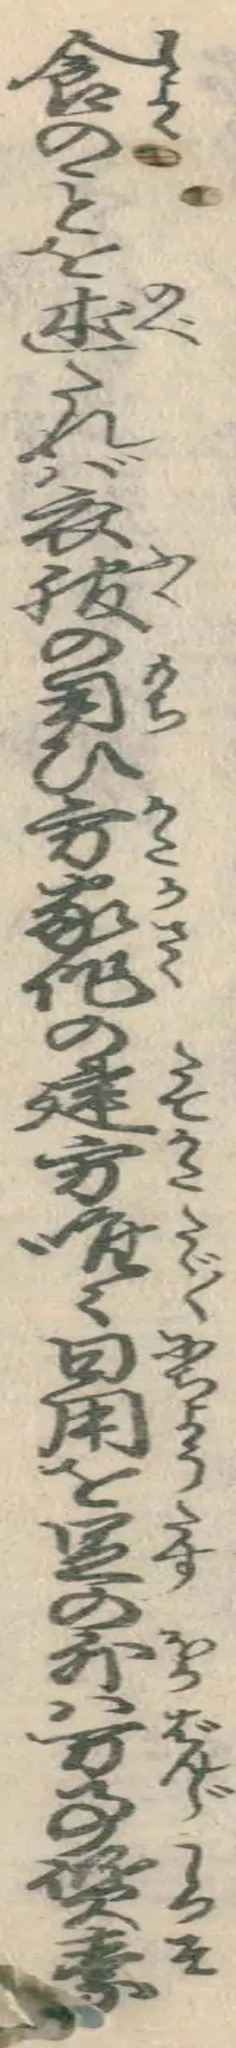食のことを述たれば衣服の用ひ方家作の建方唯々日用を足の外は万事質素
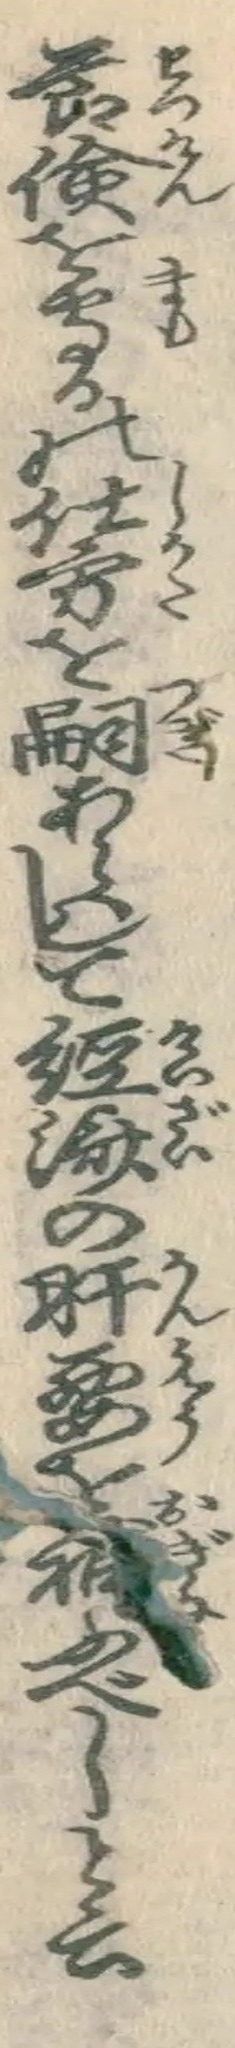節倹を守るの仕方を嗣あらはして経済の肝要を補ふべしと云

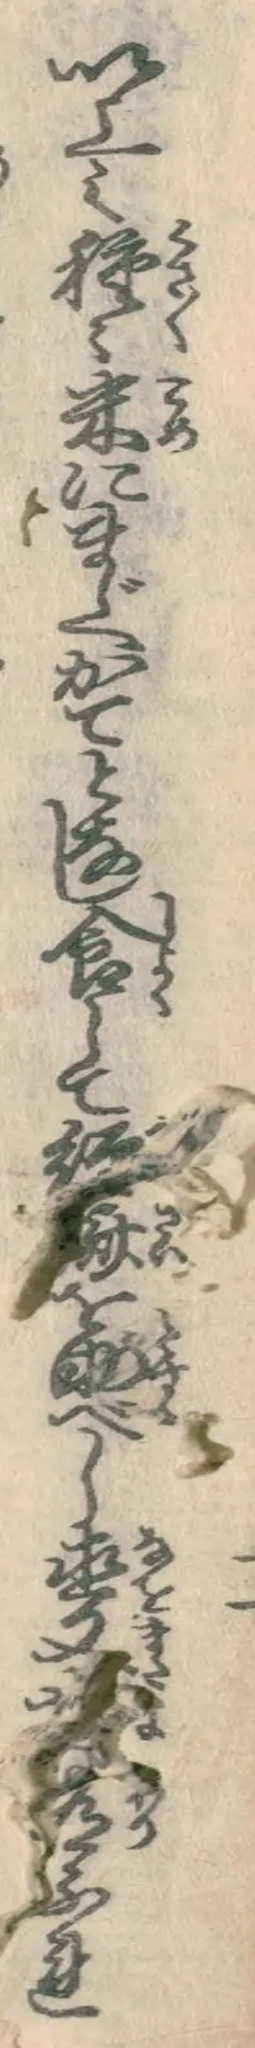以上の種々米にまじへかてとなし食して経済を助べし直又世に有ふれ
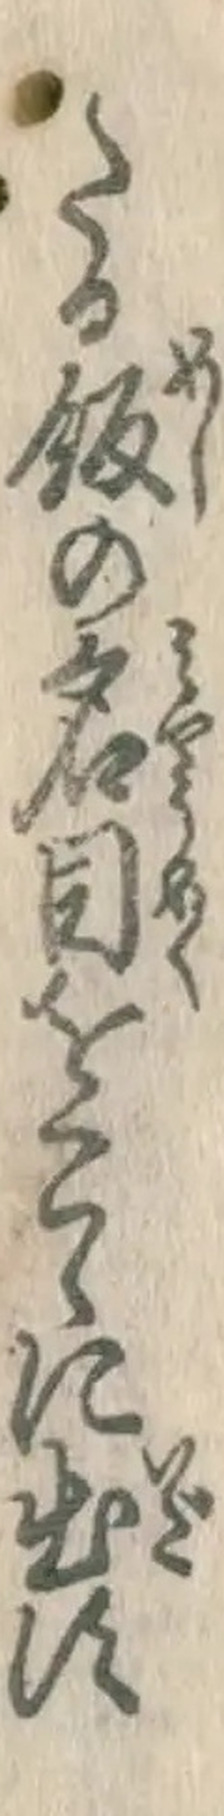たる飯の名目をこゝに出す
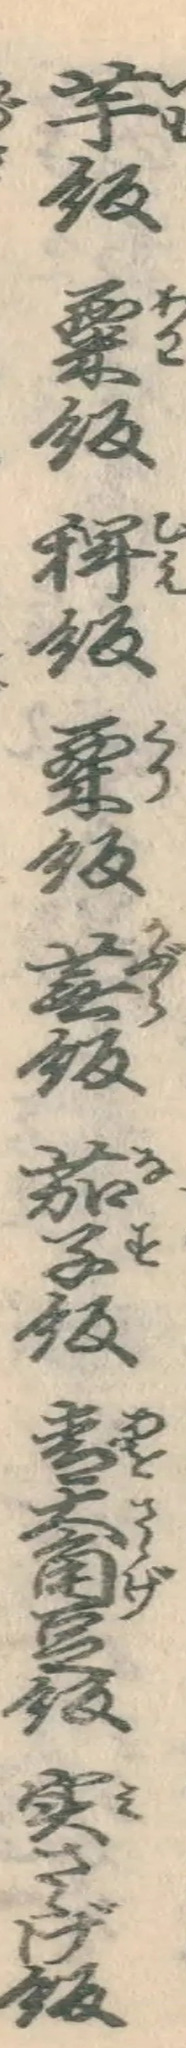芋飯粟飯稗飯栗飯蕪飯茄子飯青大角豆飯実さゝげ飯
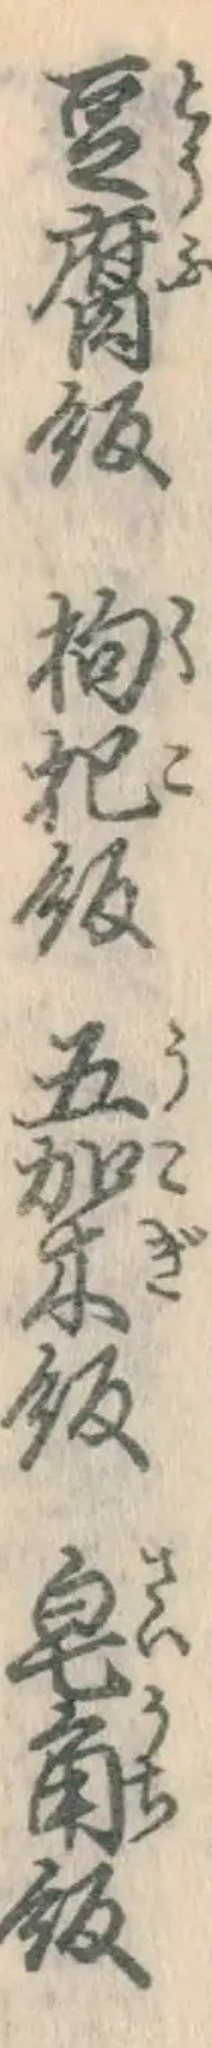豆腐飯枸杞飯五加木飯皂角飯
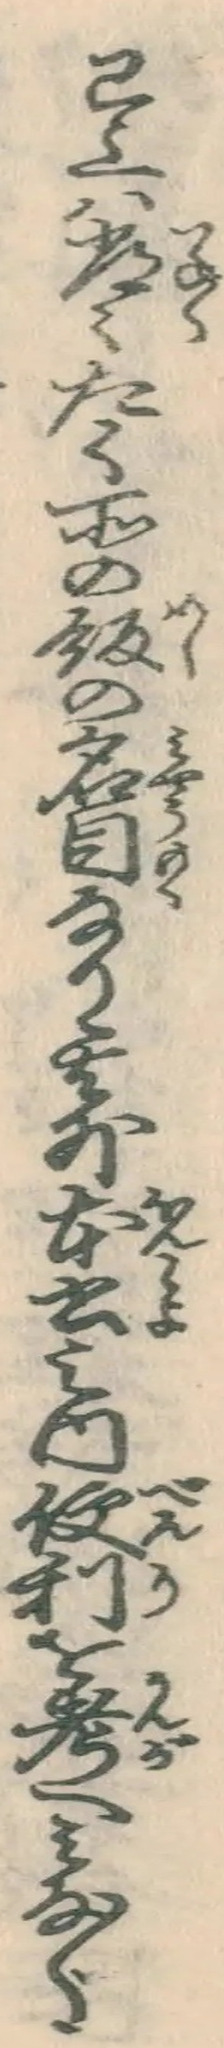已上は常々たく所の飯の名目なり其外本書の内便利を考へみな〳〵
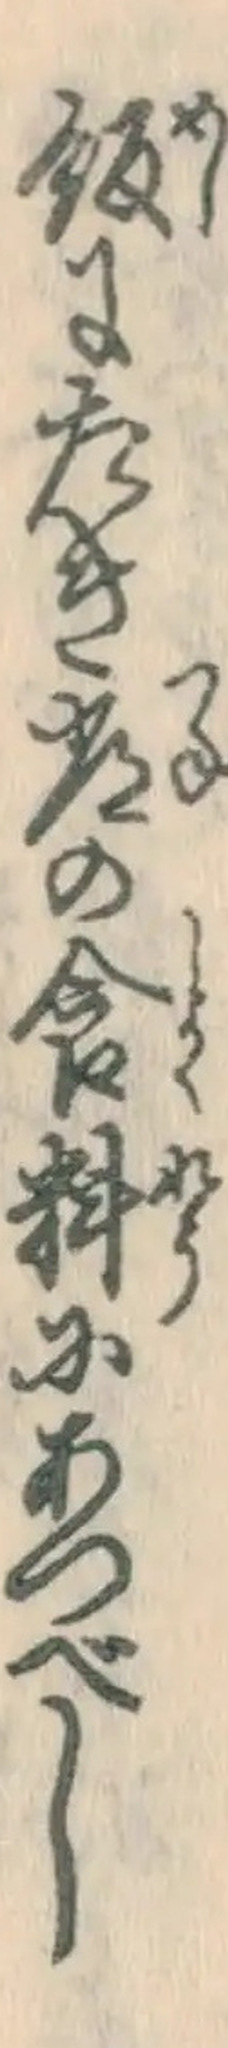飯にたき常の食料にあつべし
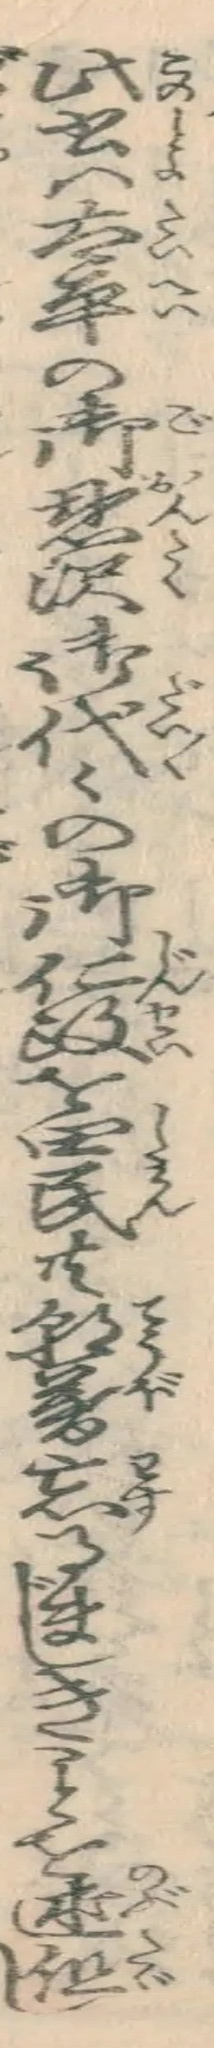此書は太平の御恩沢御代々の御仁政を四民共朝暮忘るまじきことを述但し
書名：経済をしへ草
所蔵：国立国会図書館 National Diet Library, JAPAN
